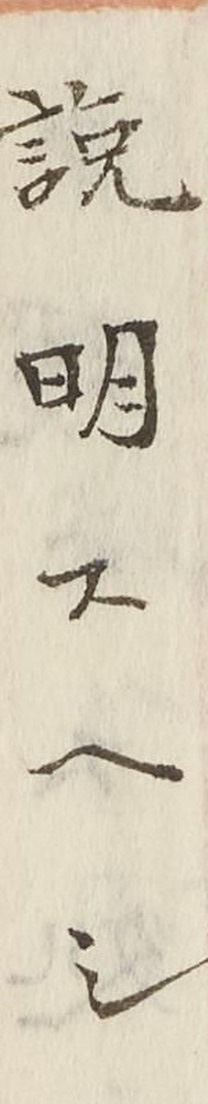説明スヘシ
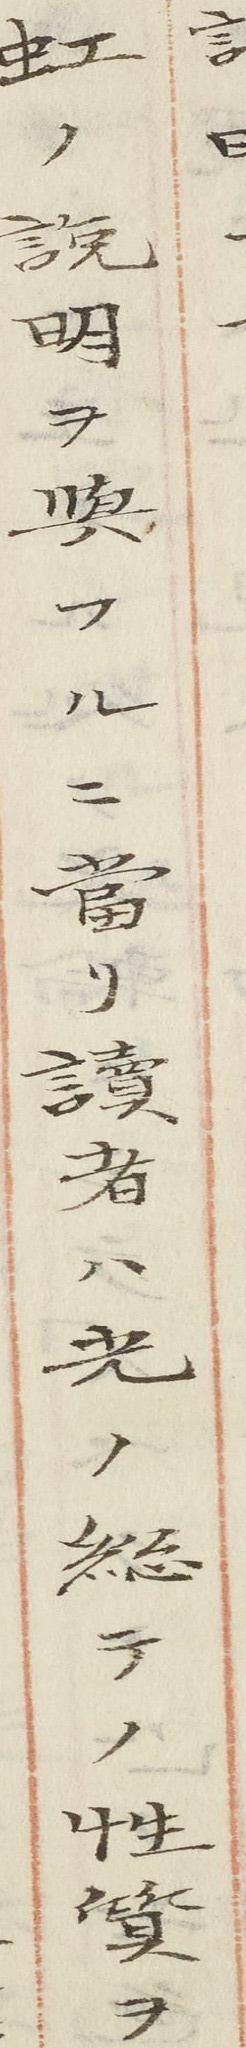虹ノ説明ヲ与フルニ当リ読者ハ光ノ総テノ性質ヲ
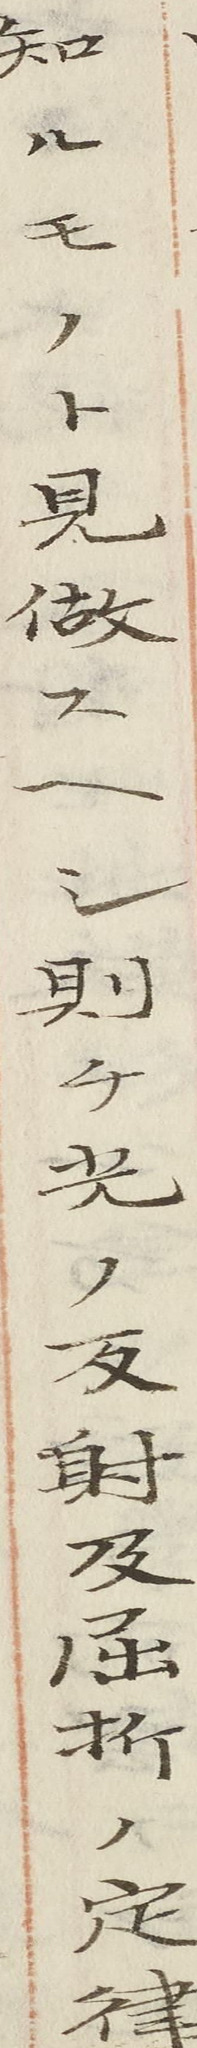知ルモノト見做スヘシ則チ光ノ反射及屈折ノ定律
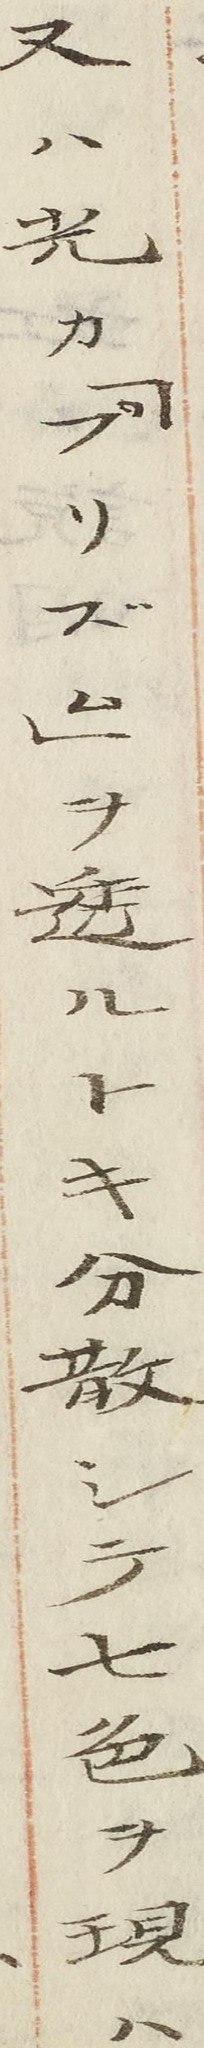又ハ光カ「プリズム」ヲ透ルトキ分散シテ七色ヲ現ハ
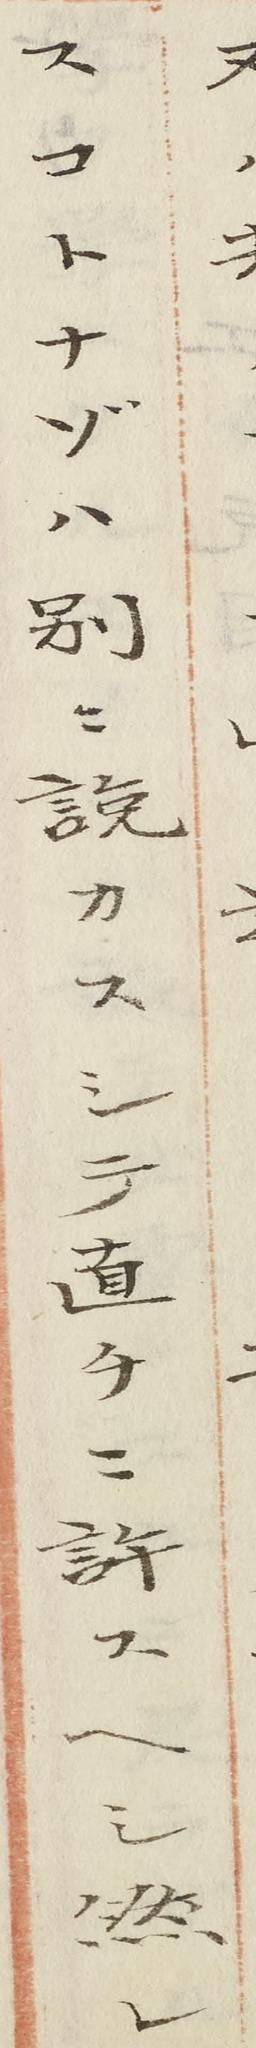スコトナゾハ別ニ説カスシテ直チニ許スヘシ然レ
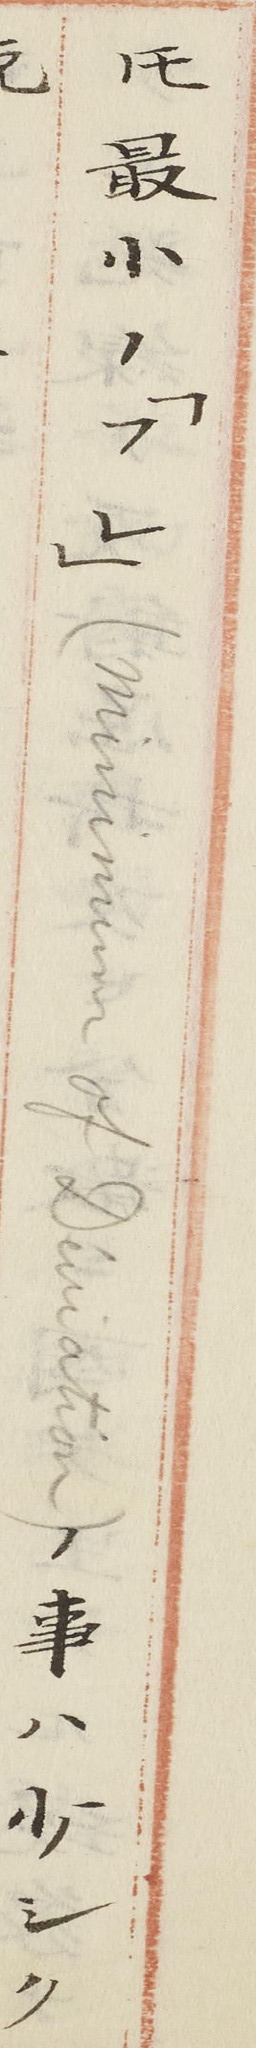トモ最小ノ「フレ」ノ事ハ少シク
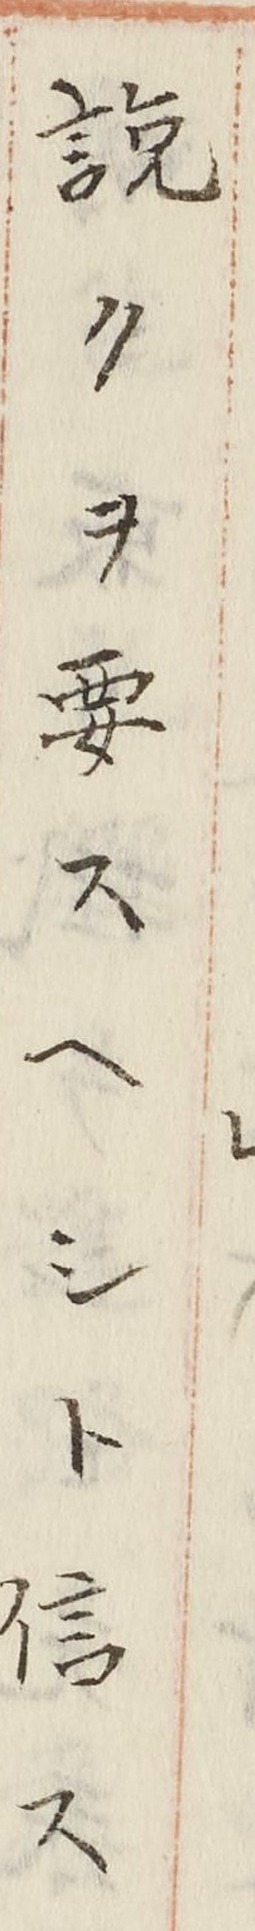説クヲ要スヘシト信ス
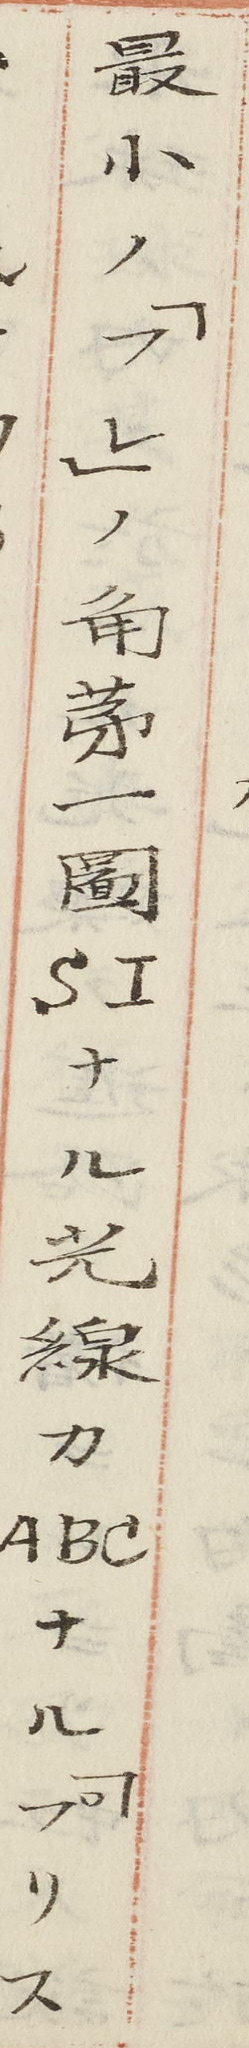最小ノ「フレ」ノ角第一図ＳＩナル光線カＡＢＣナル「プリス
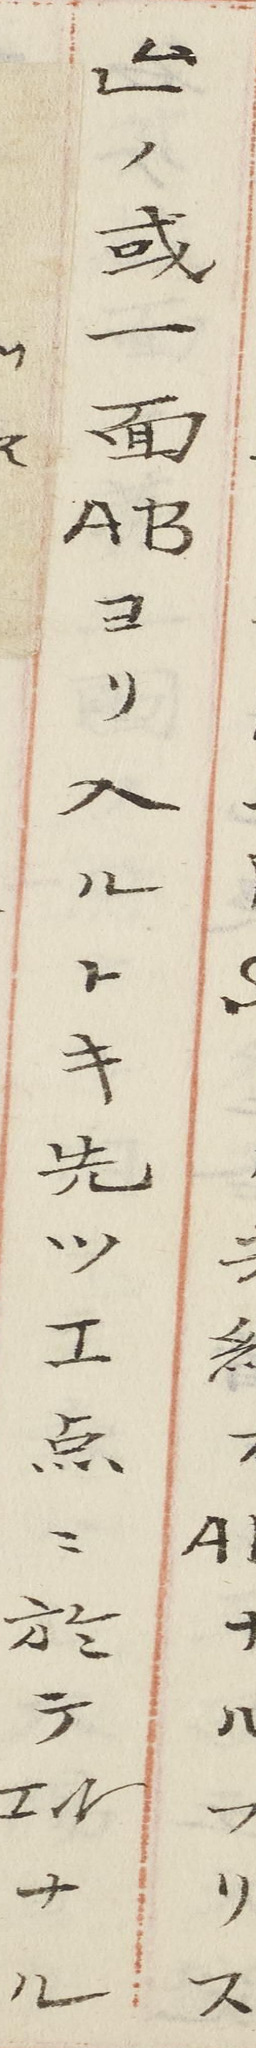ム」ノ或一面ＡＢヨリ入ルトキ先ツＩ点ニ於テＩＮナル
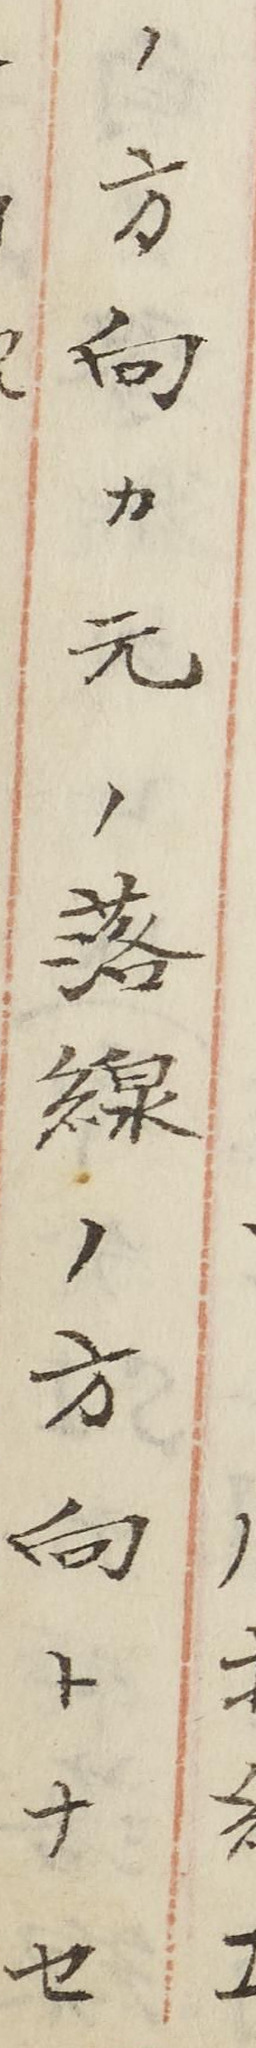ニノ方向カ元ノ落線ノ方向トナセ

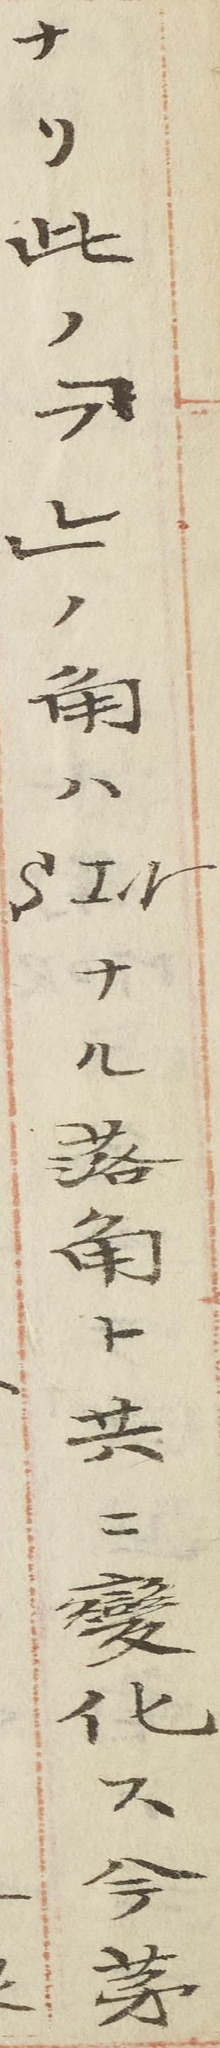ナリ此ノ「フレ」ノ角ハＳＩＮナル落角ト共ニ変化ス今第
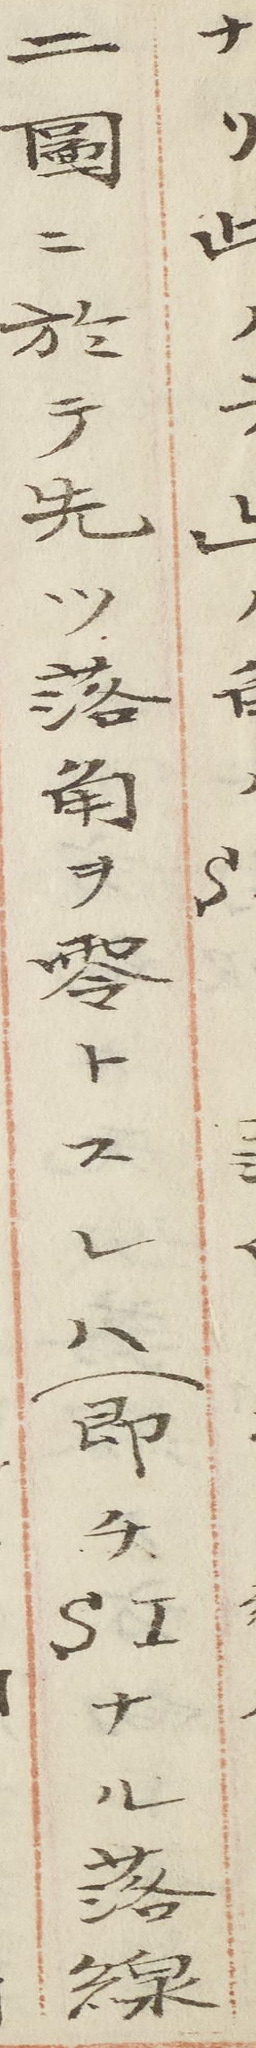二図ニ於テ先ツ落角ヲ零トスレハ（即チＳＩナル落線
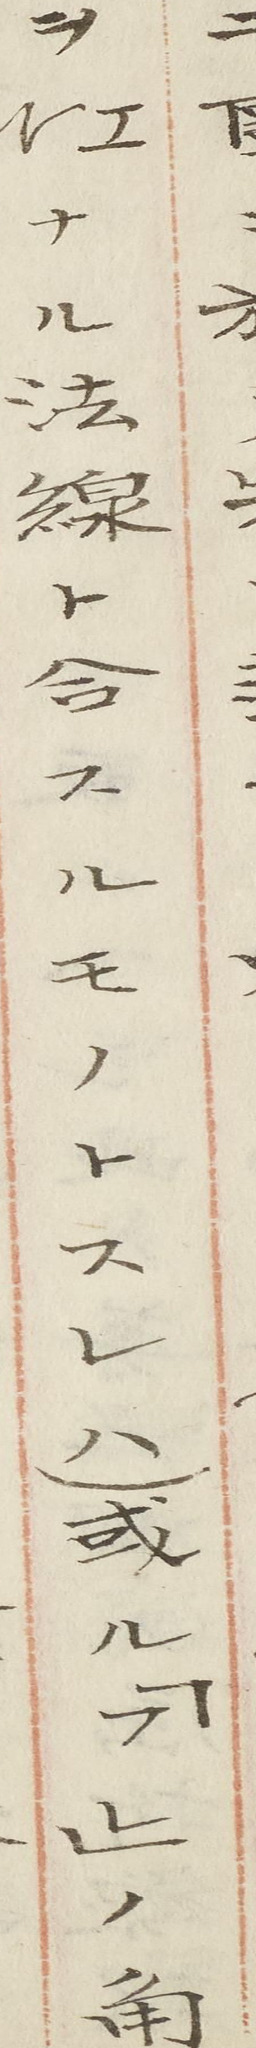ヲＮＩナル法線ト合スルモノトスレハ）或ル「フレ」ノ角
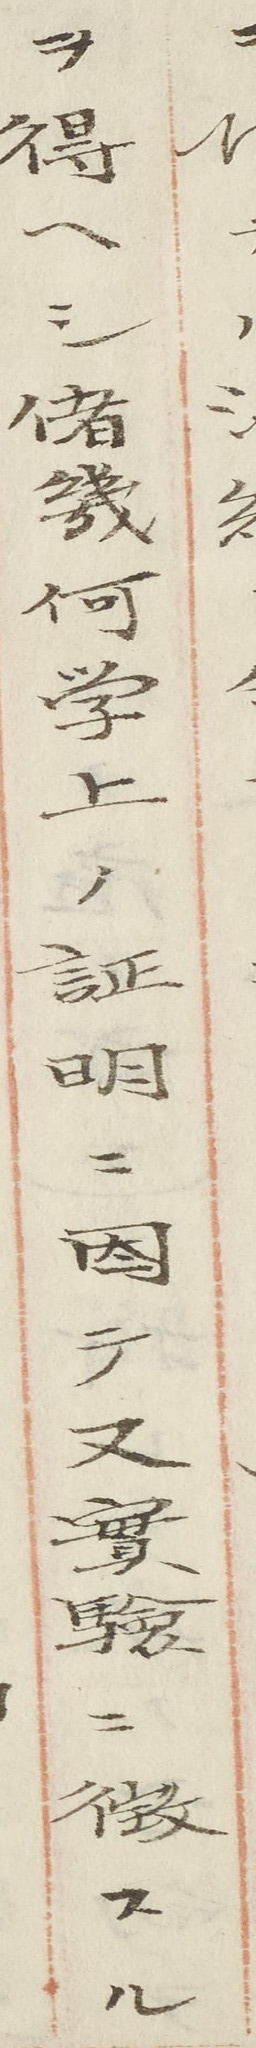ヲ得ヘシ偖幾何学上ノ証明ニ因テ又実験ニ徴スル
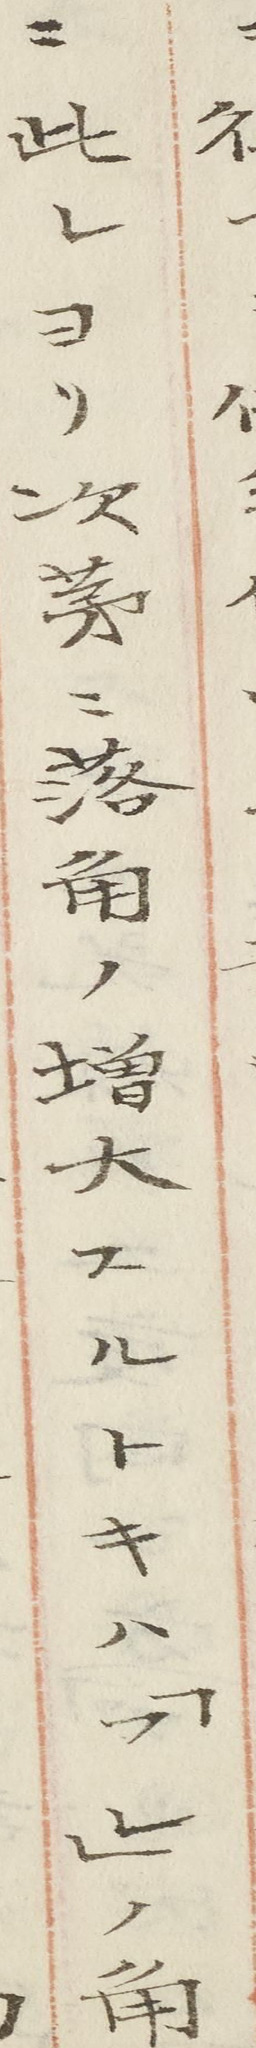ニ此レヨリ次第ニ落角ノ増大スルトキハ「フレ」ノ角
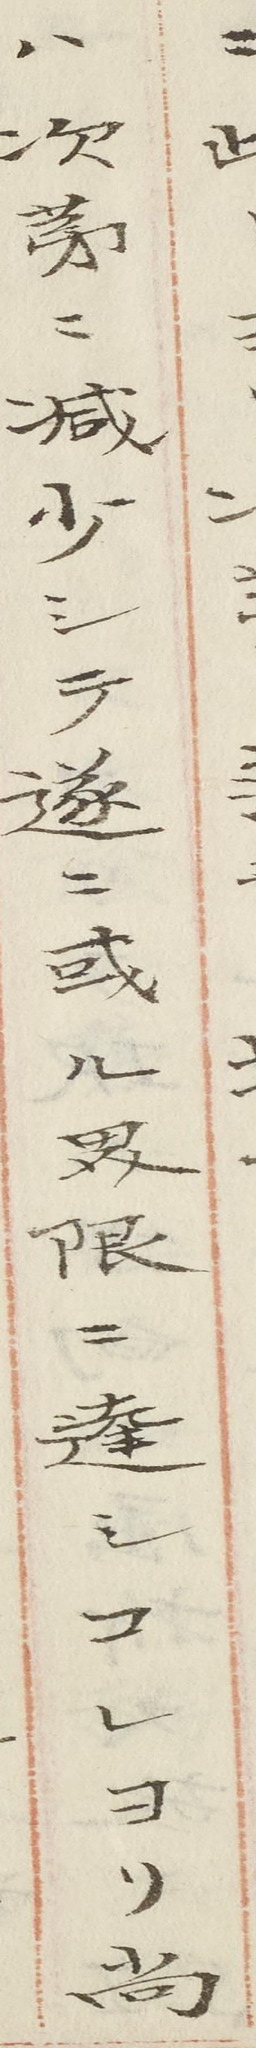ハ次第ニ減少シテ遂ニ或ル界限ニ達シコレヨリ尚
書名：虹及ハロノ説明
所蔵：東京大学地震研究所図書室 Earthquake Research Institute Library, The University of Tokyo, JAPAN
